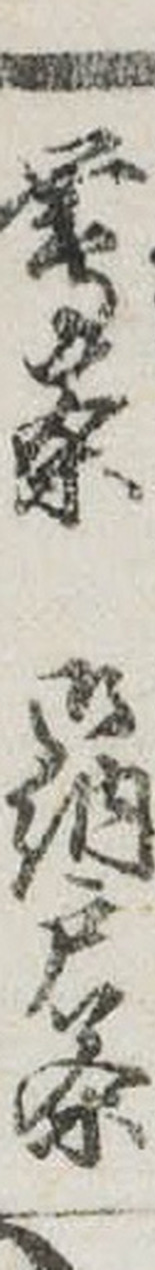鶯茶御納戸茶
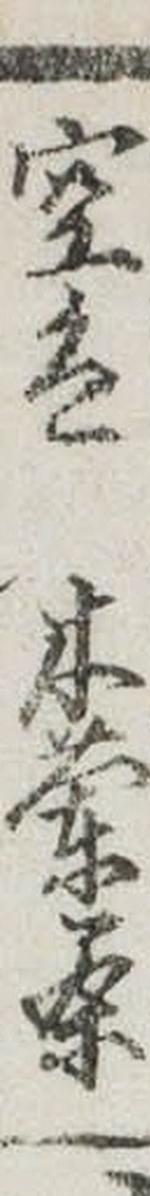空色木蘭茶
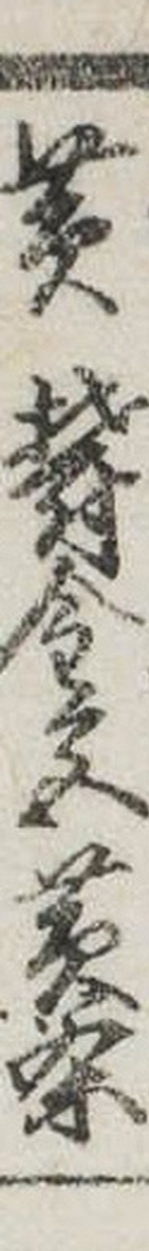黄鬱金色黄茶
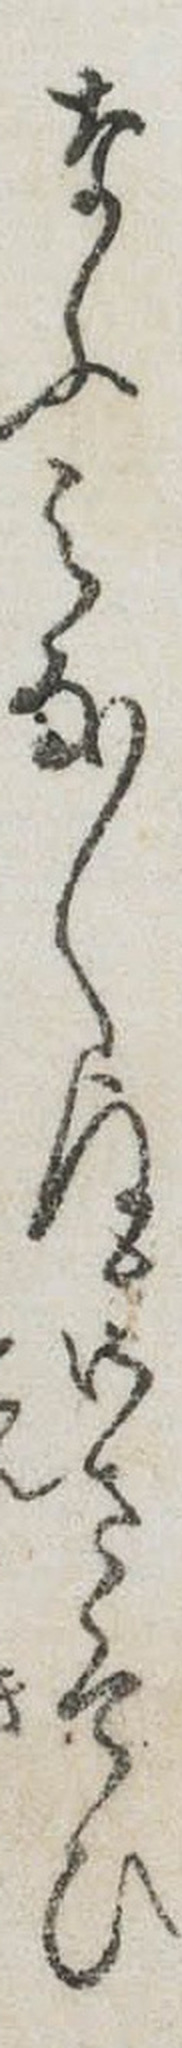なふみな〳〵さま御さそひ
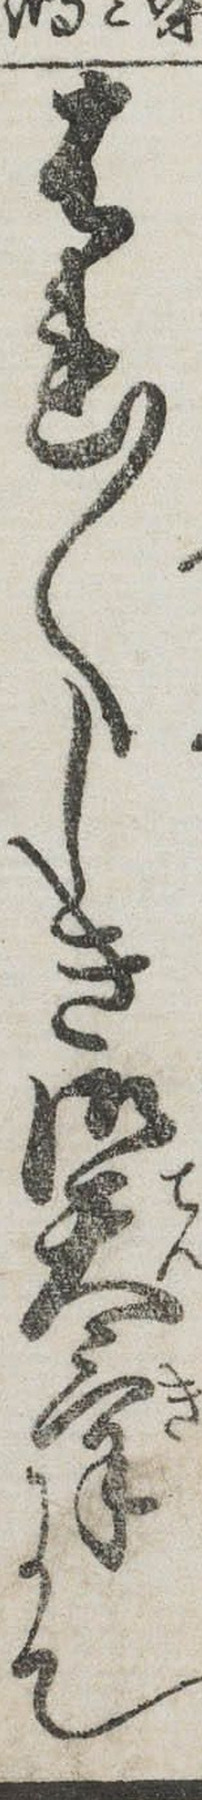はれ〳〵しき御天気にて
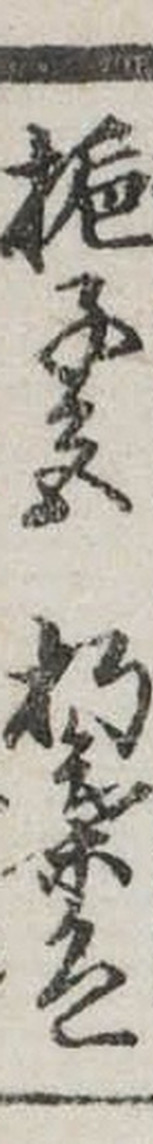梔子色朽葉色
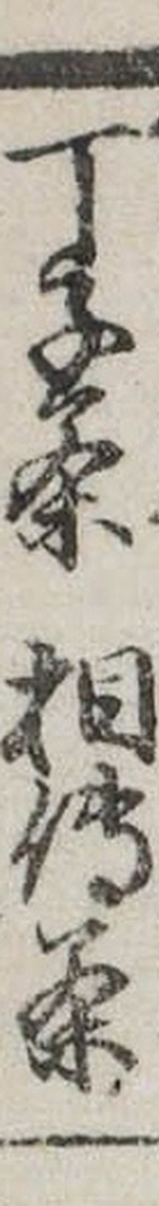丁子茶相伝茶
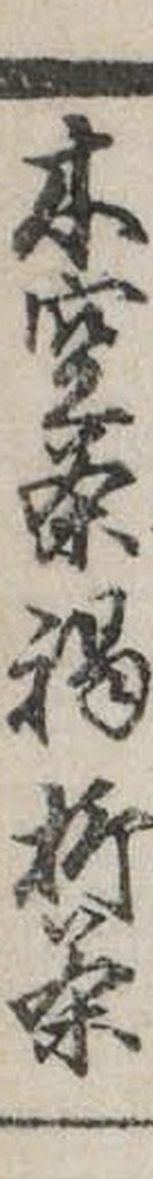木空茶褐柳茶
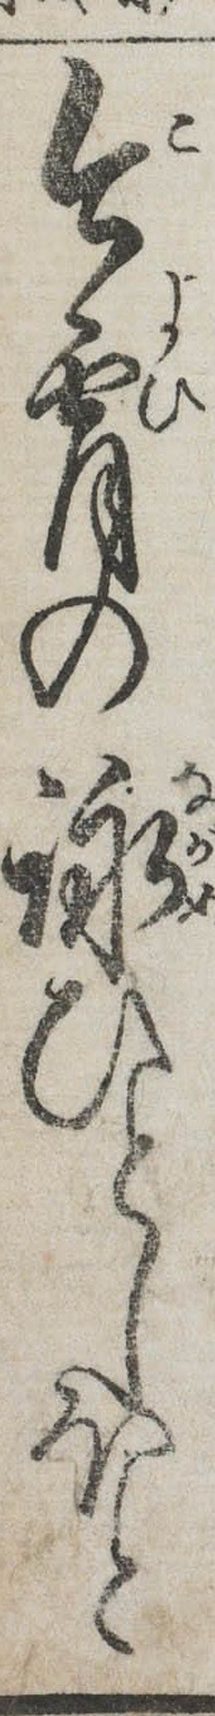今宵の詠ひとしほと

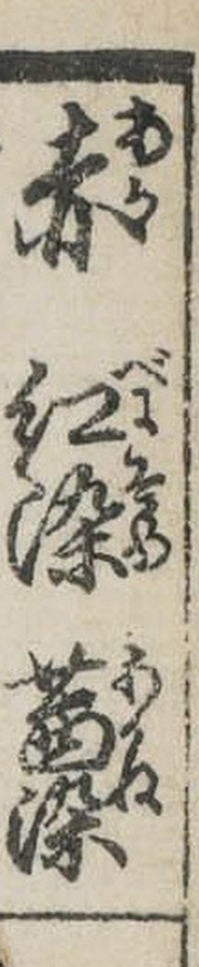赤紅染茜染
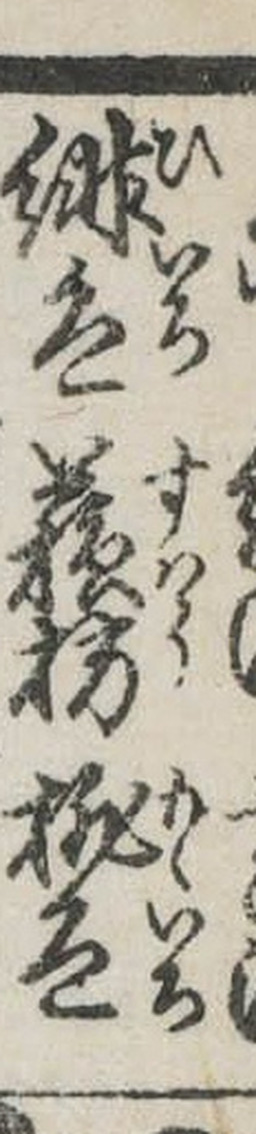緋色蘓枋桃色
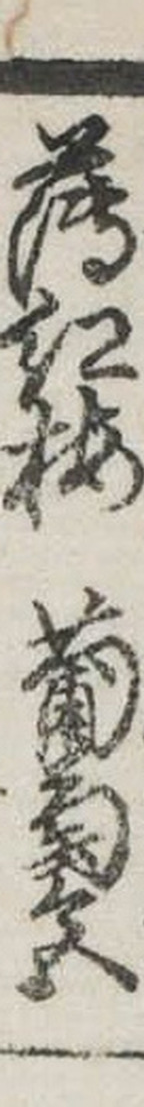薄紅梅葡萄色
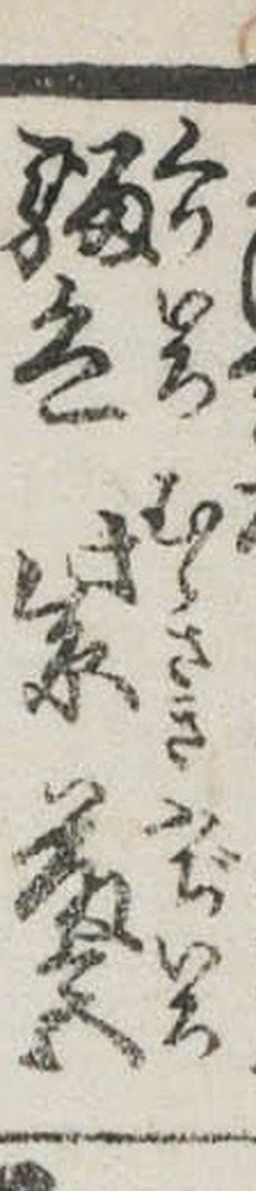騮色紫藤色
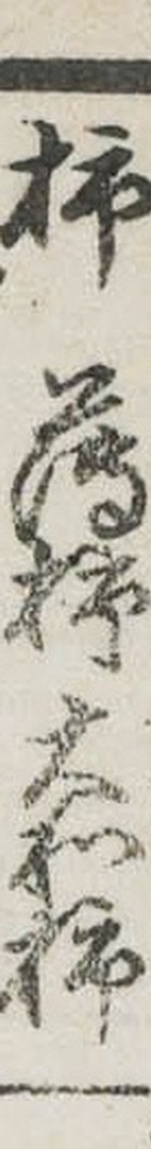柿薄柿大和柿
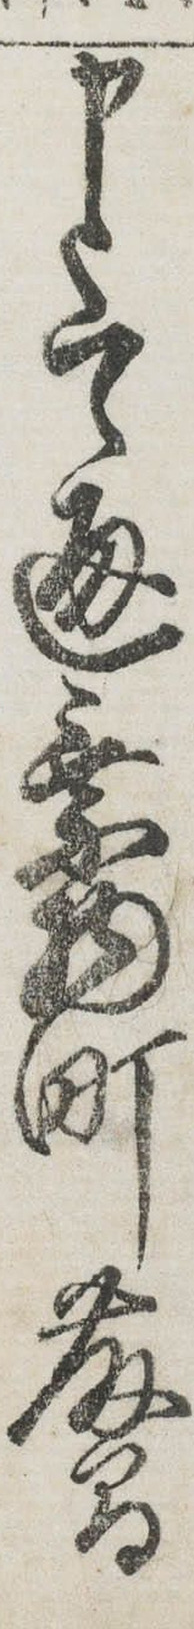申上候通乗物町藤間
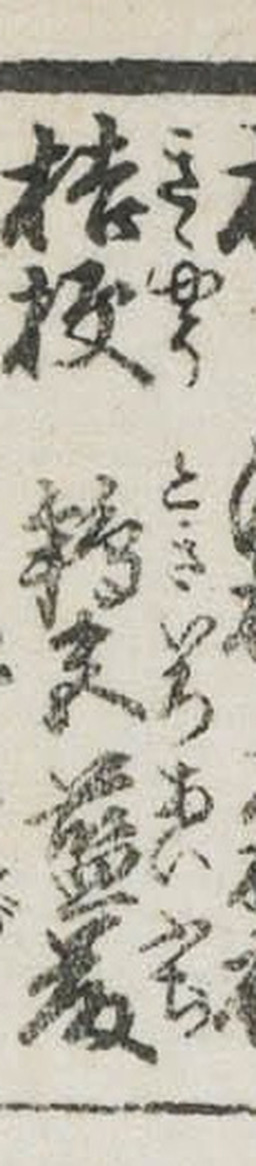桔梗鴇色藍藤
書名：頭書萬用婦人手紙之文言
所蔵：東京学芸大学教育コンテンツアーカイブ
